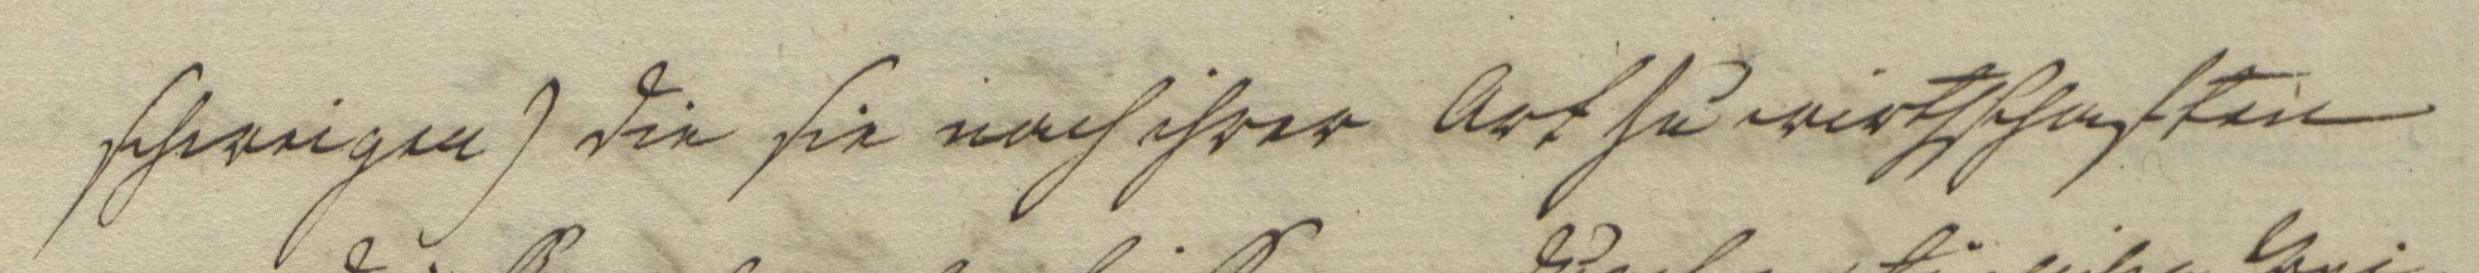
schweigen) die sie nach ihrer Art zu wirthschaften
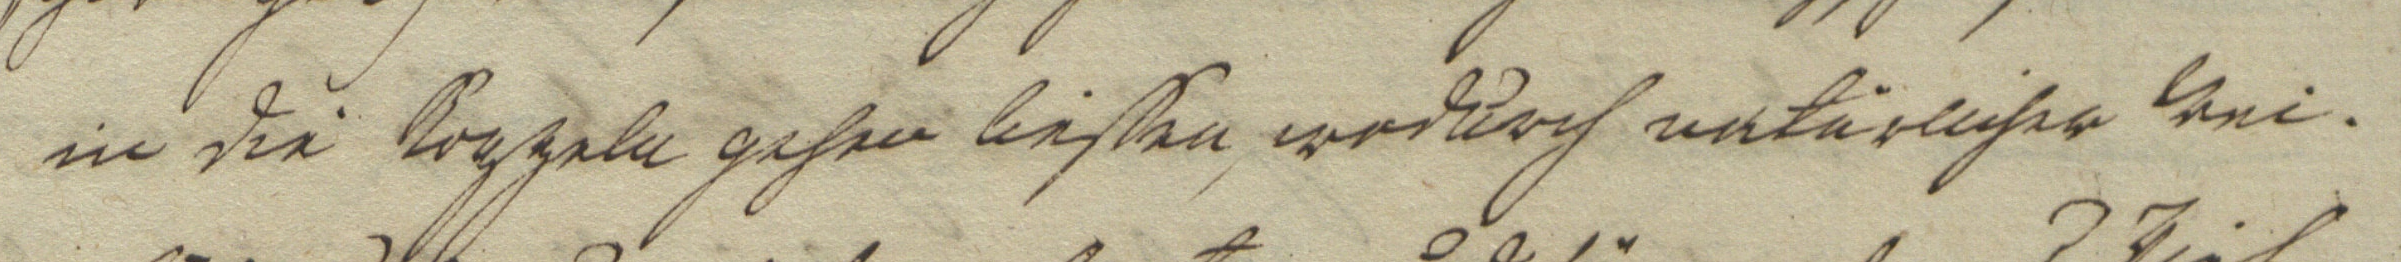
in die Koppeln gehen liessen, wodurch natürlicher Wei¬
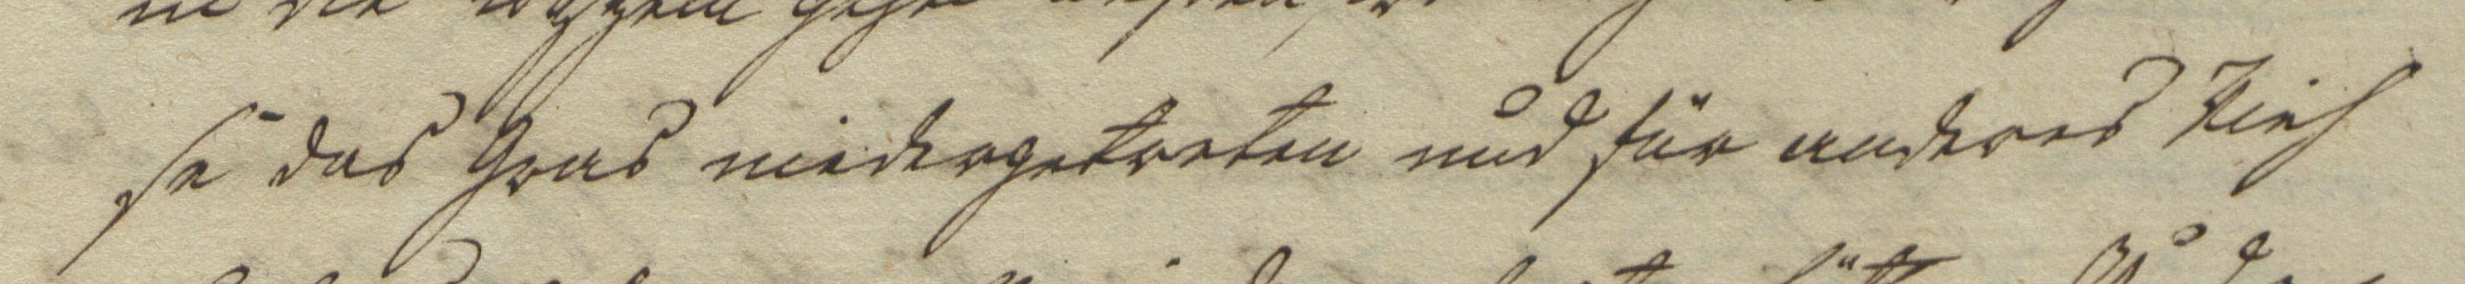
se das Gras niedergetreten und für andres Vieh
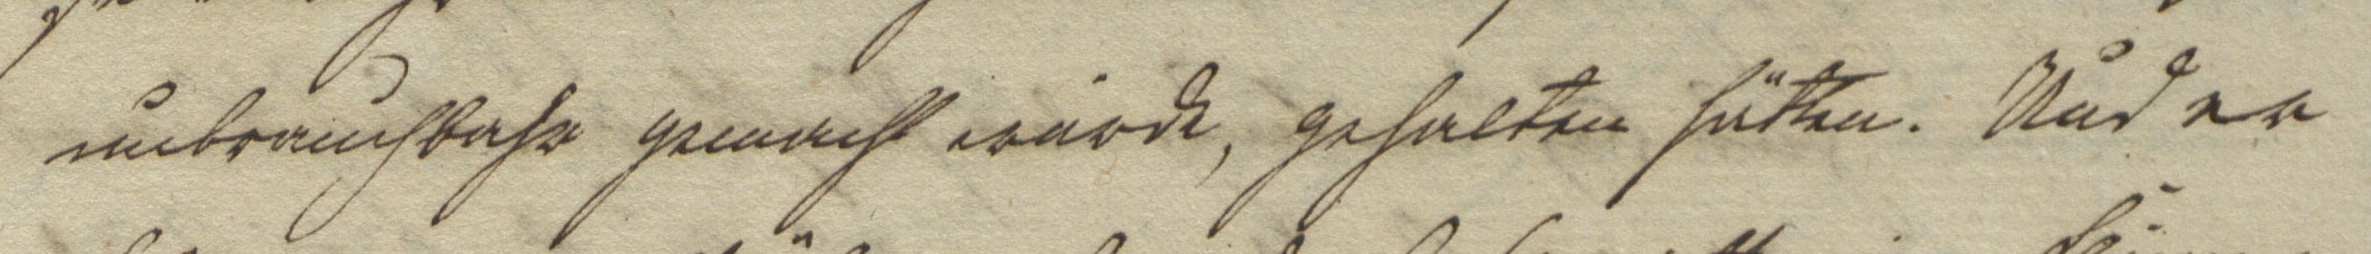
unbrauchbahr gemacht würde, gehalten hätten. Und er
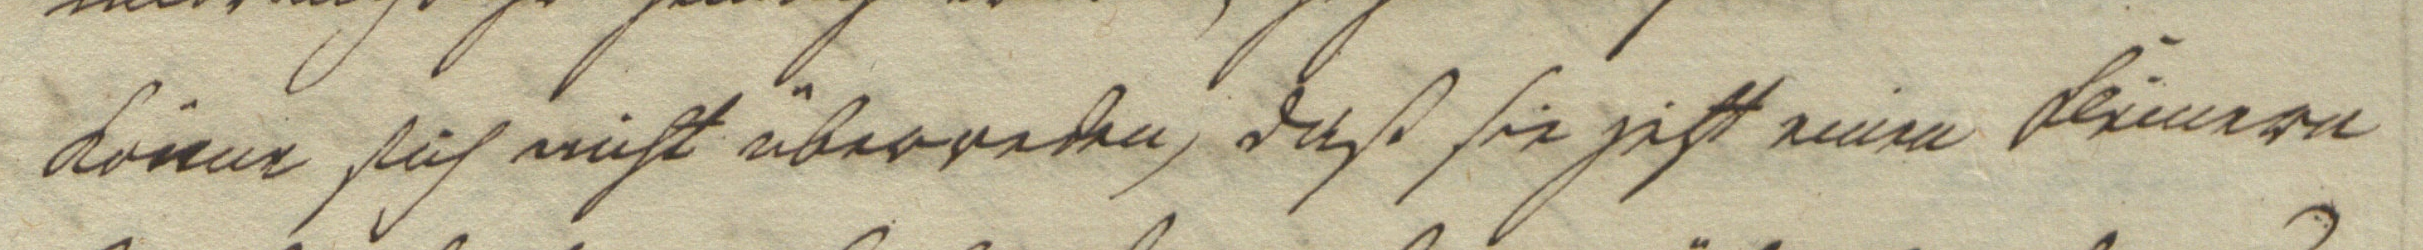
könne sich nicht überreden, daß sie jetzt einen kleinern
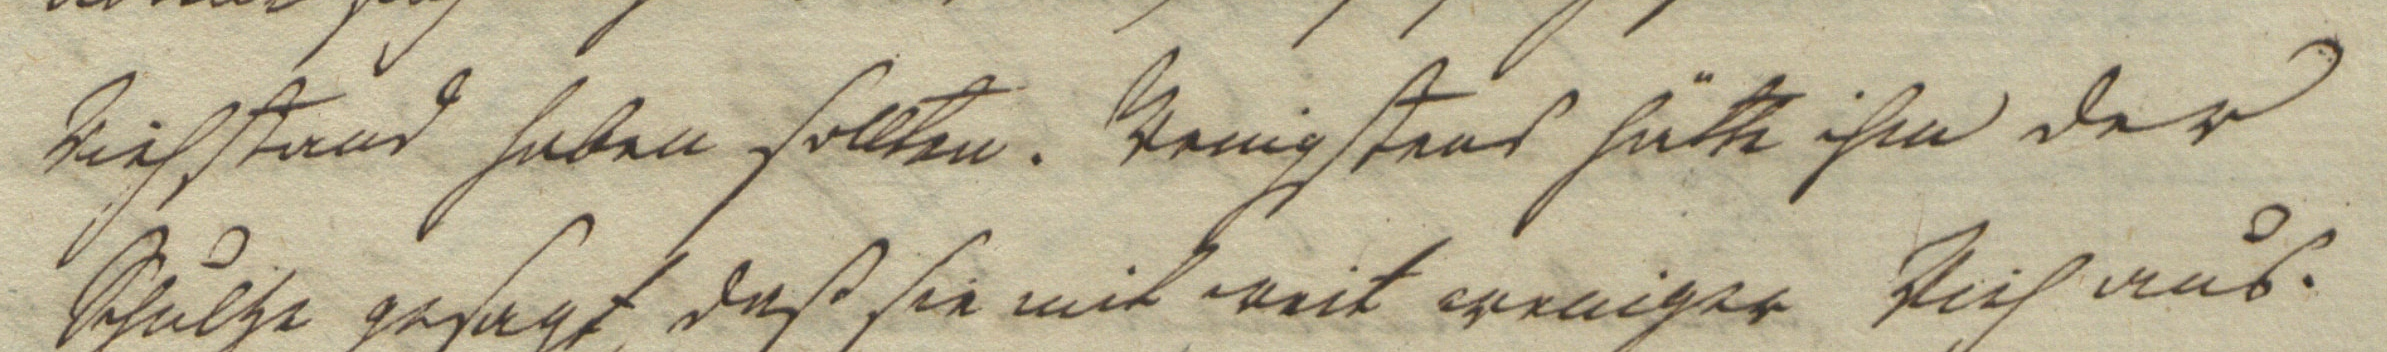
Viehstand haben sollten. Wenigstens hätte ihm der
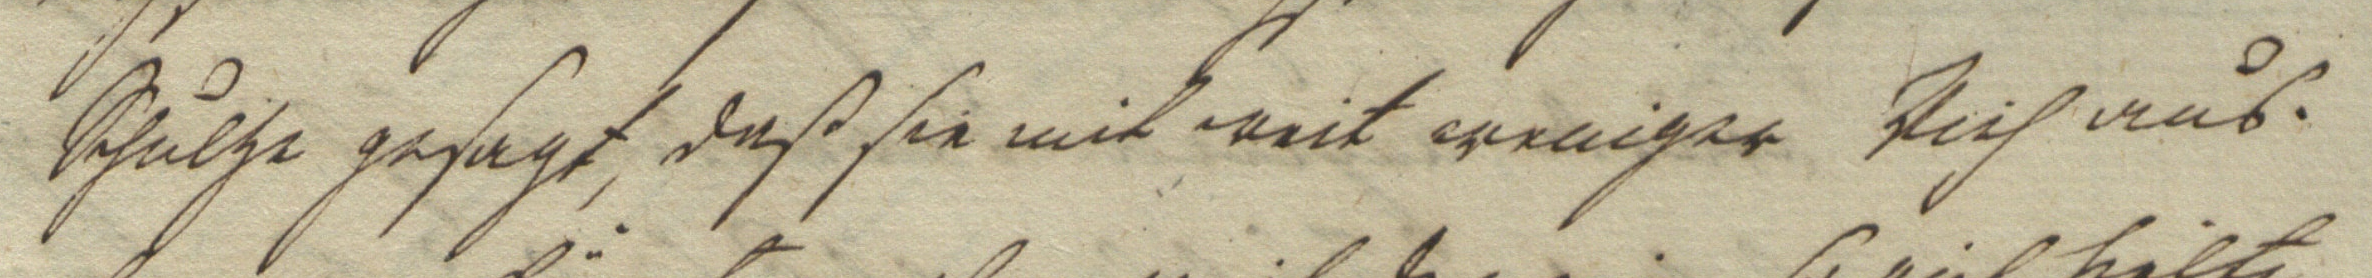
Schulze gesagt, daß sie mit weit weniger Vieh aus-
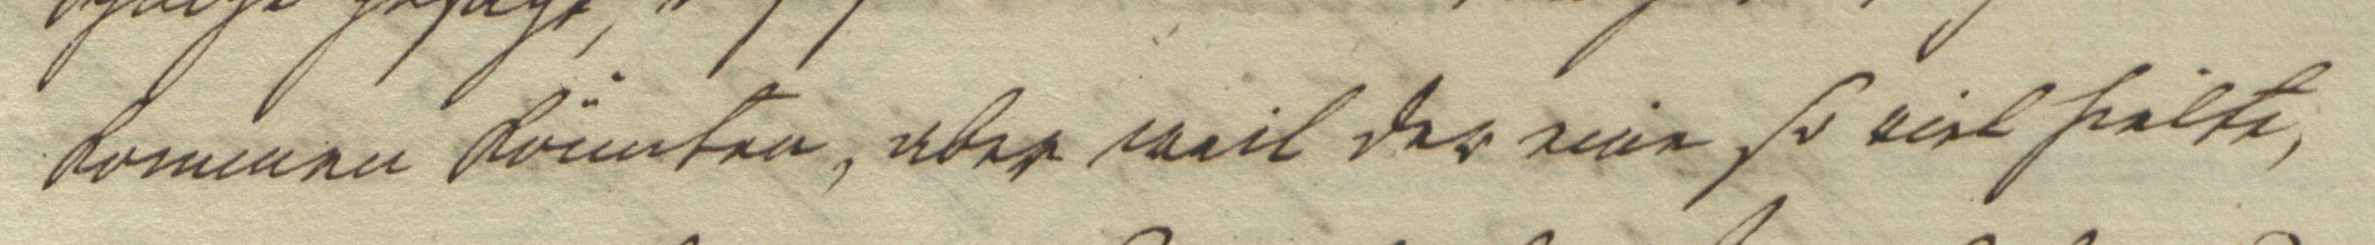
kommen könnten, aber weil der eine so viel hielte,
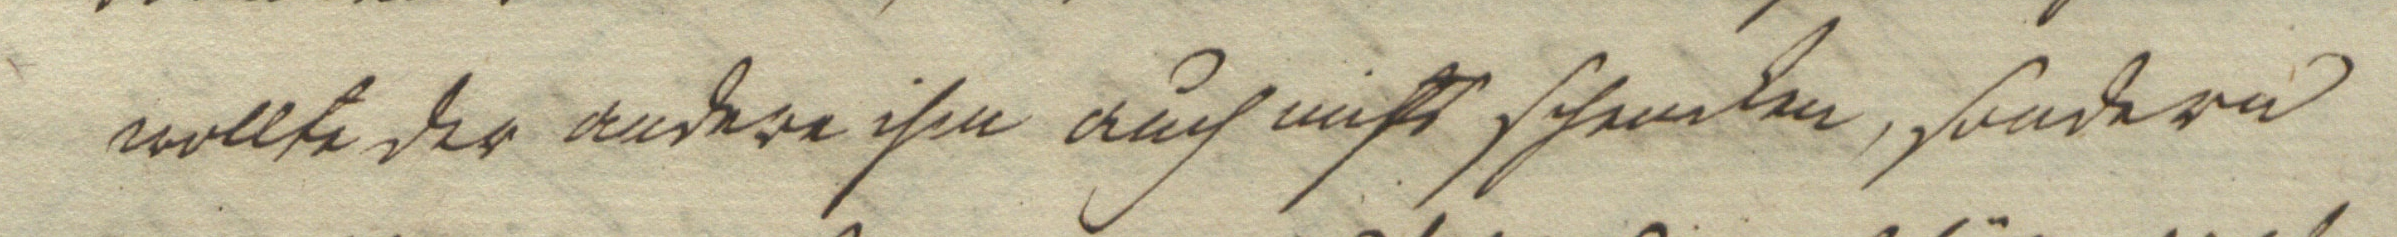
wollte der andere ihm auch nichts schenken, sondern
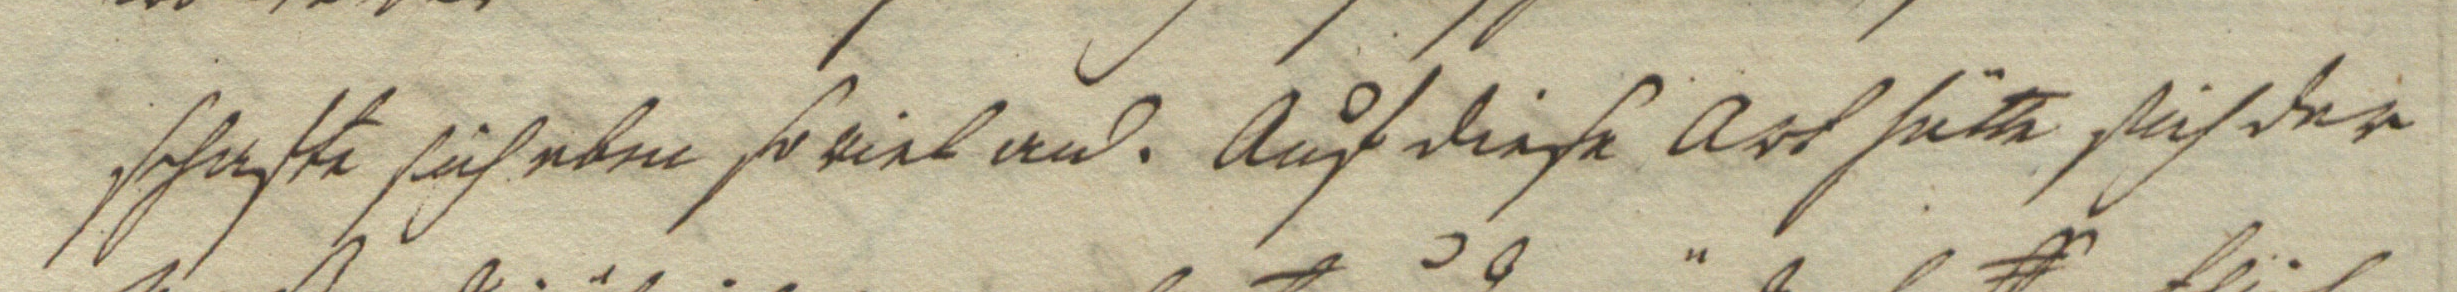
schafte sich eben so viel an. Auf diese Art hätte sich der
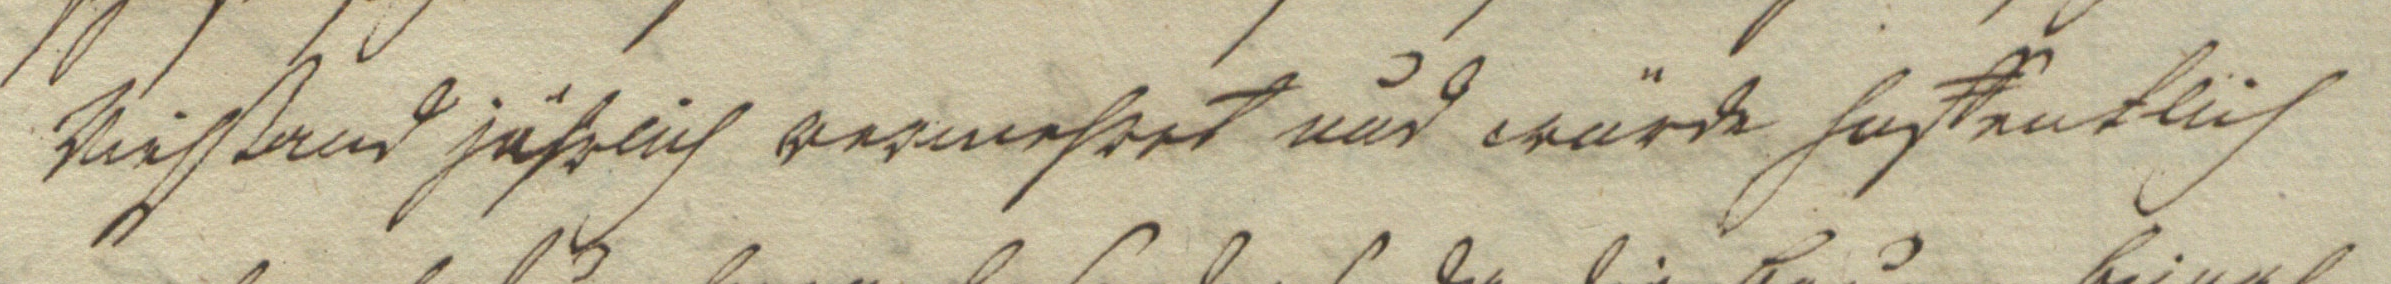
Viehstand jährlich vermehret und würde hoffentlich
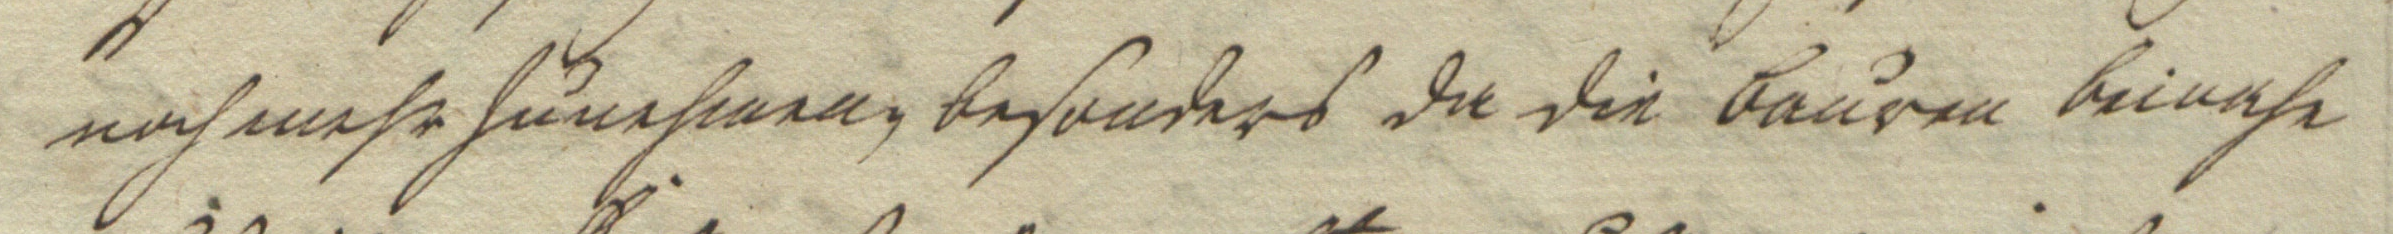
noch mehr zunehmen, besonders da die Bauren beinahe
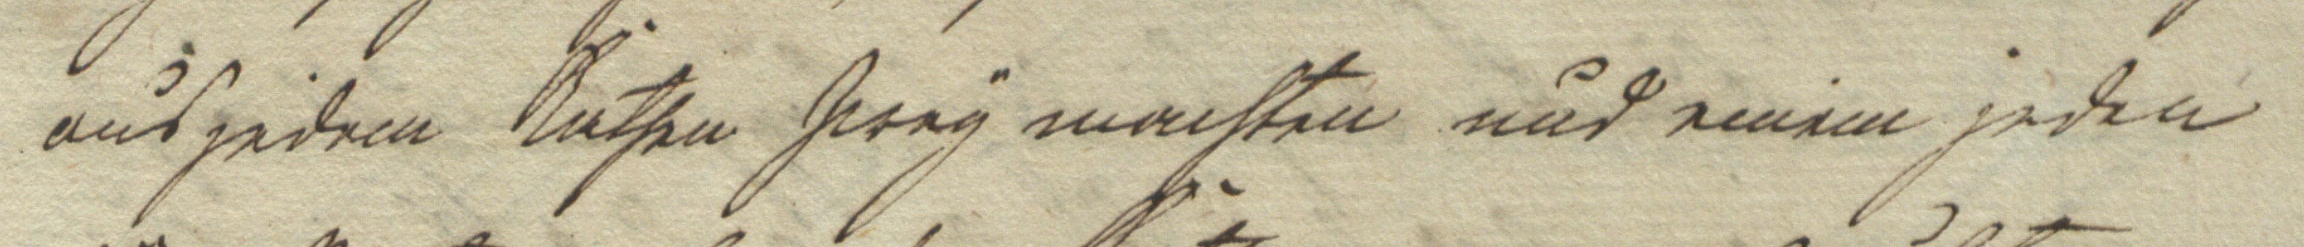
aus jedem Kathen zwey machten und einem jeden
